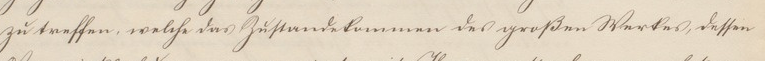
zu treffen, welche das Zustandekommen des großen Wertes, dessen
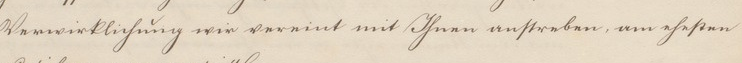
Verwirklichung wir vereint mit Ihnen anstreben, am ehesten
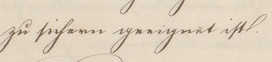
zu sichern geeignet ist.
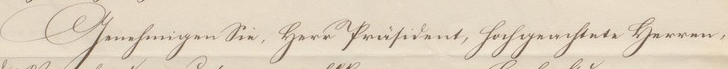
Genehmigen Sie, Herr Präsident, hochgeachtete Herren,
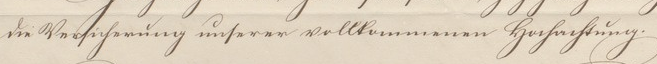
die Versicherung unserer vollkommenen Hochachtung.
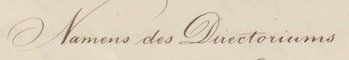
Namens des Directoriums
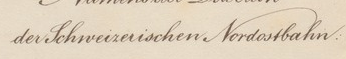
der Schweizerischen Centralbahn:
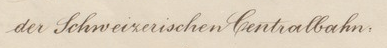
der Schweizerischen Nordostbahn:
